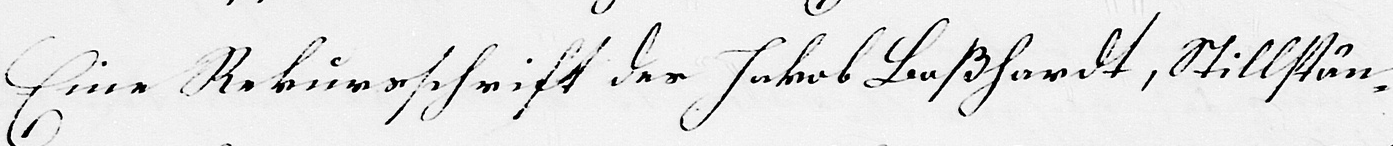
Eine Rekursschrift des Jakob Boßhardt, Stillstan¬
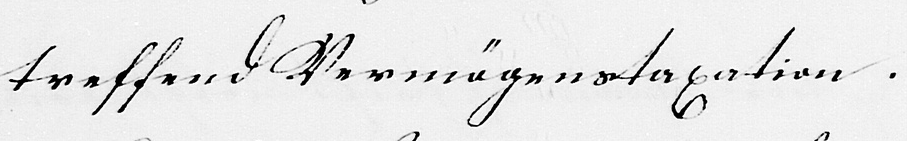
treffend Vermögenstaxation.
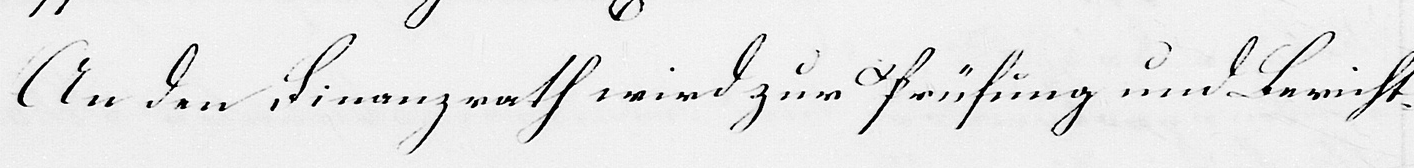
An den Finanzrath wird zur Prüfung und Bericht¬
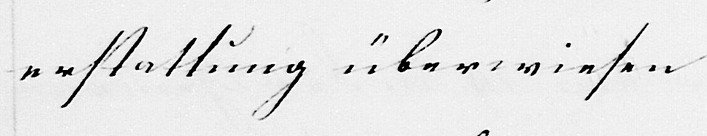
erstattung überwiesen
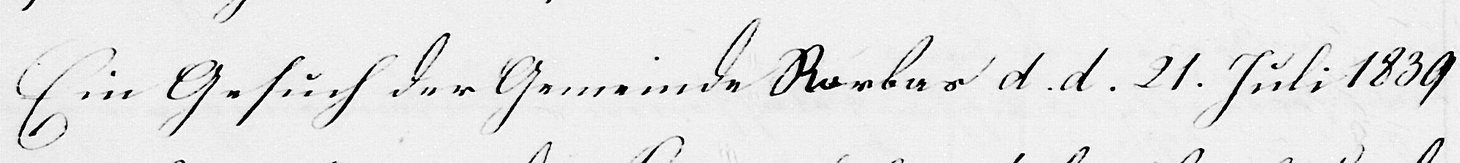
Ein Gesuch der Gemeinde Rorbas d. d. 21. Juli 1839
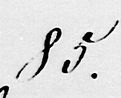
d. d.
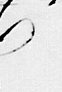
2.
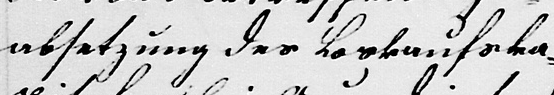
absetzung des Loskaufska¬
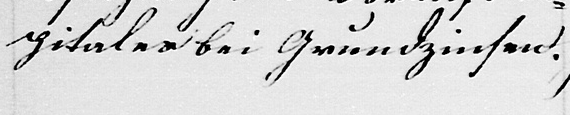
pitales bei Grundzinsen.
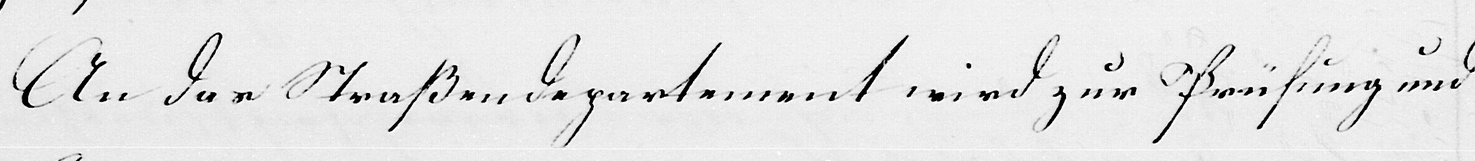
An das Straßendepartement wird zur Prüfung und
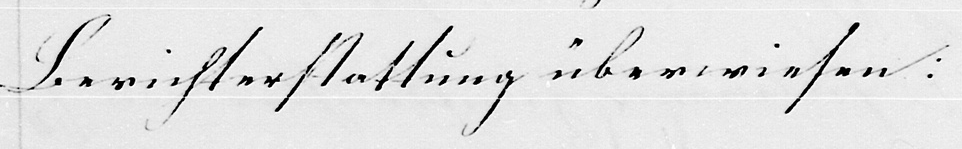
Berichterstattung überwiesen:
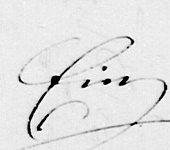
zung
